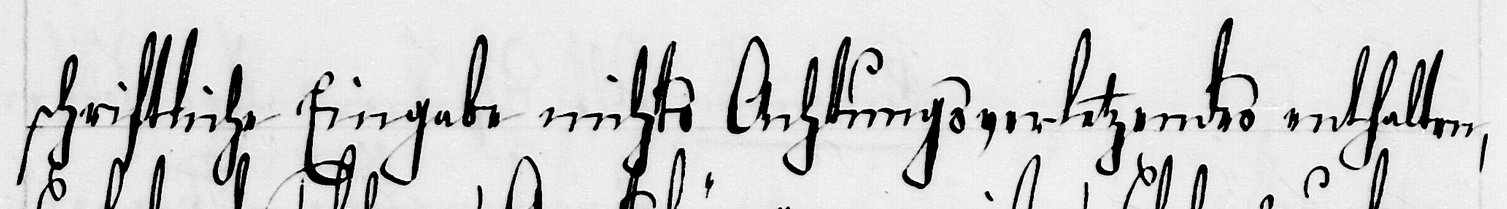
schriftliche Eingabe nichts Achtungsverletzendes enthalten,
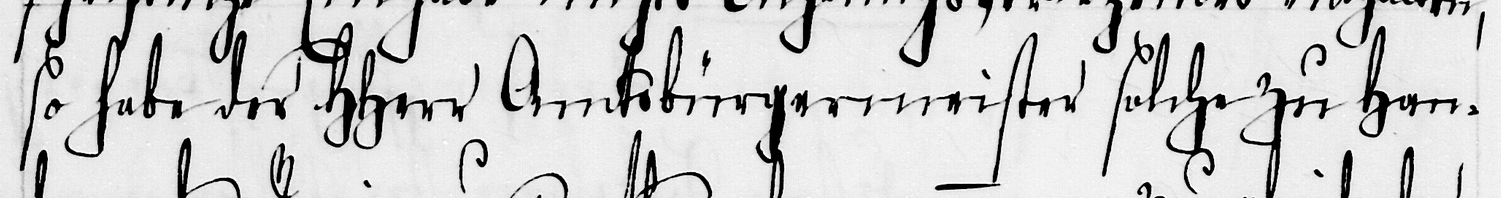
so habe der HHerr Amtsbürgermeister solche zu Han¬
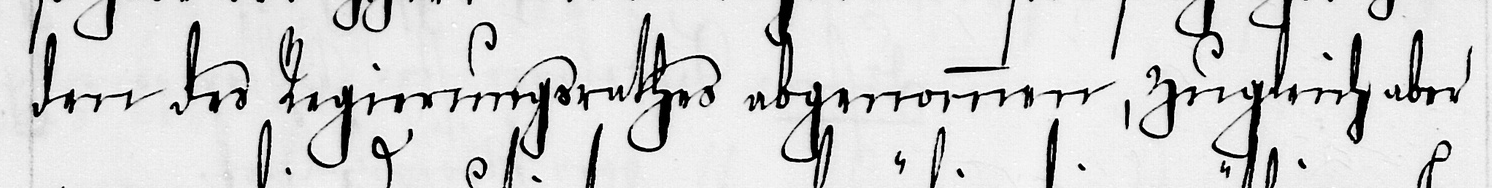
den des Regierungsrathes abgenommen, zugleich aber
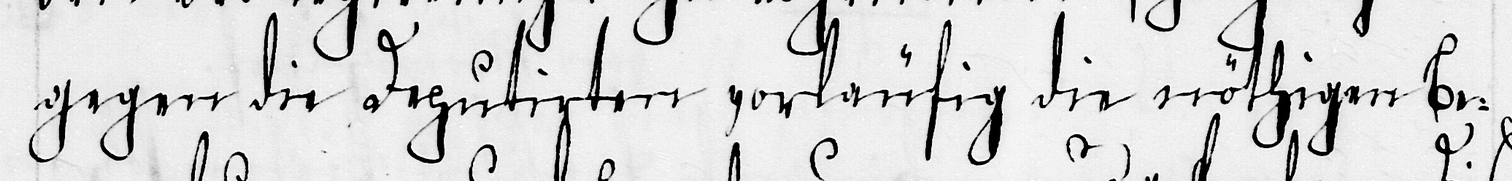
gegen die Deputirten vorläufig die nöthigen Be¬
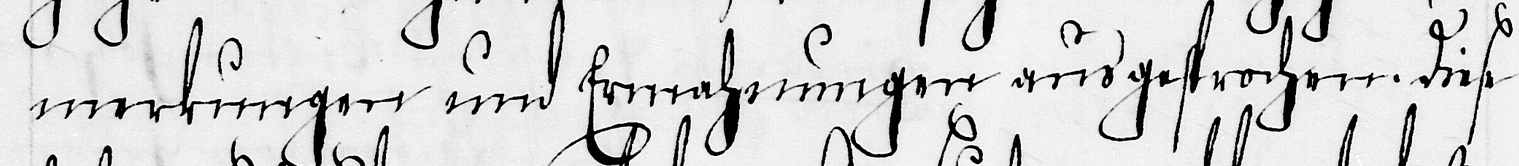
merkungen und Ermahnungen ausgesprochen. Diese
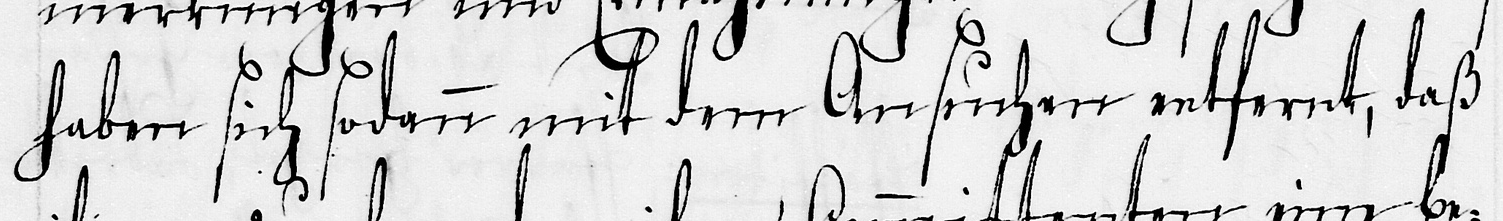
haben sich sodann mit dem Ansuchen entfernt, daß
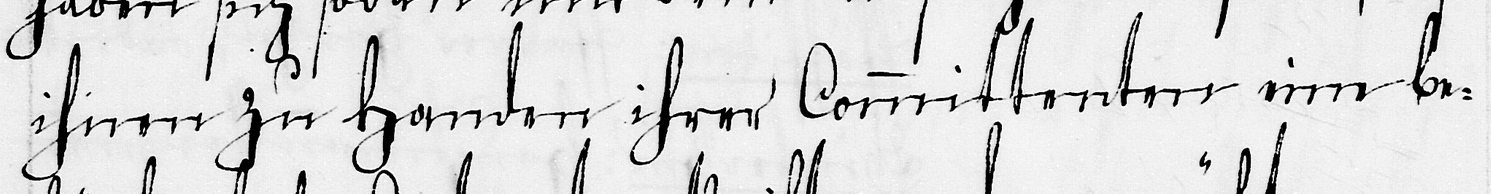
ihnen zu Handen ihrer Committenten eine be¬
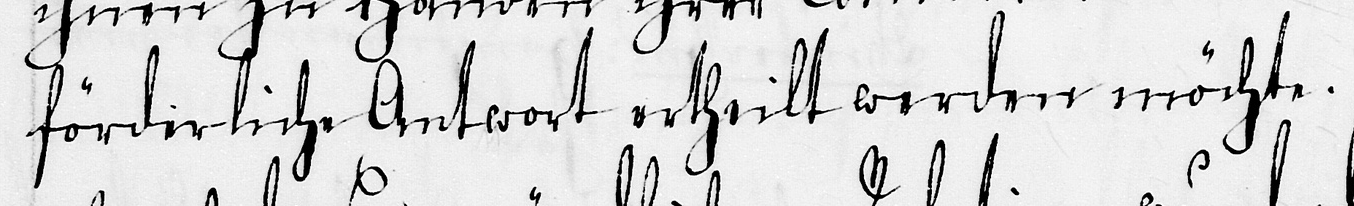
förderliche Antwort ertheilt werden möchte.
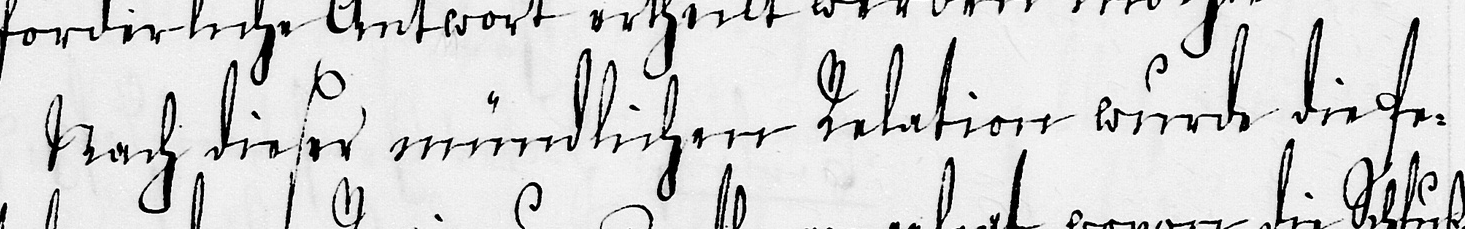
Nach dieser mündlichen Relation wurde die Pe¬
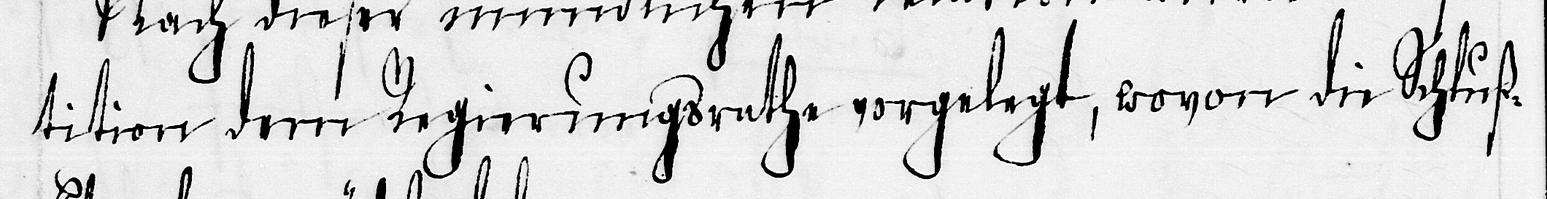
tition dem Regierungsrathe vorgelegt, wovon die Schluß¬
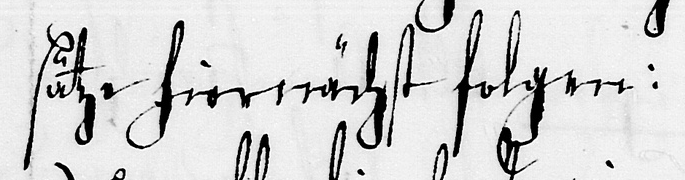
sätze hiernächst folgen:
